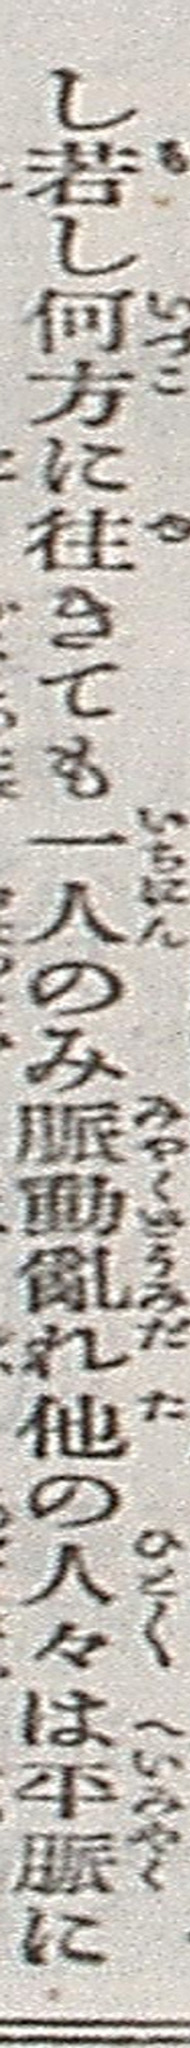し若し何方に往きても一人のみ脈動乱れ他の人々は平脈に
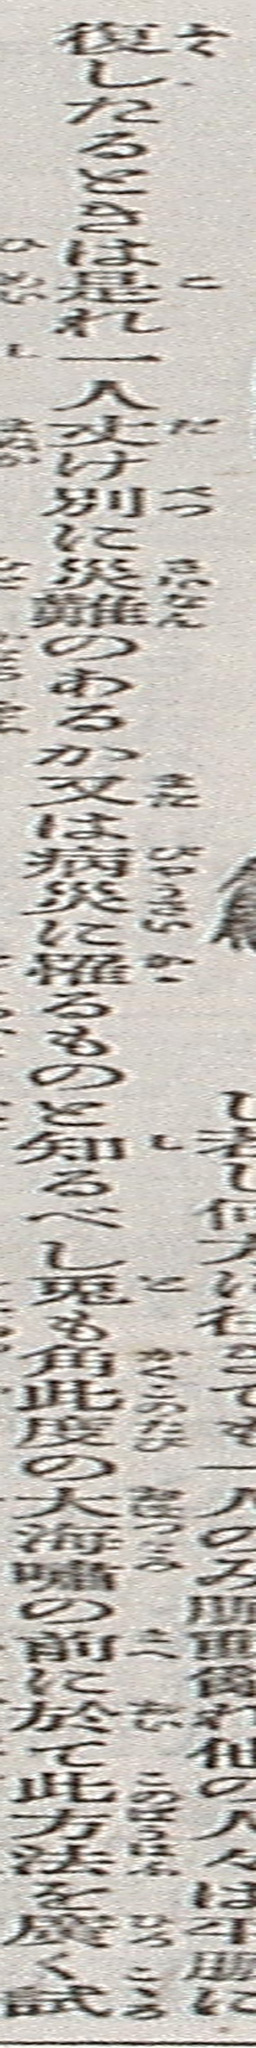復したるときは是れ一人丈だけ別に災難のあるか又は病災に罹るものと知るべし兎も角此度の大海嘯の前に於て此方法を広く試
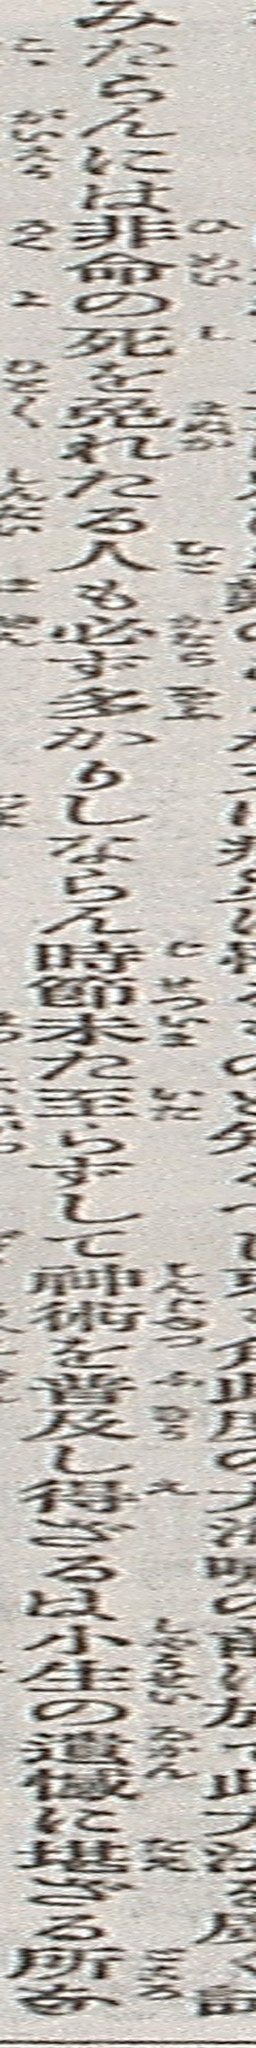みたらんには非命の死を免れたる人も必ず多かりしならん時節未た至らずして神術を普及し得ざるは小生の遺憾に堪ざる所な
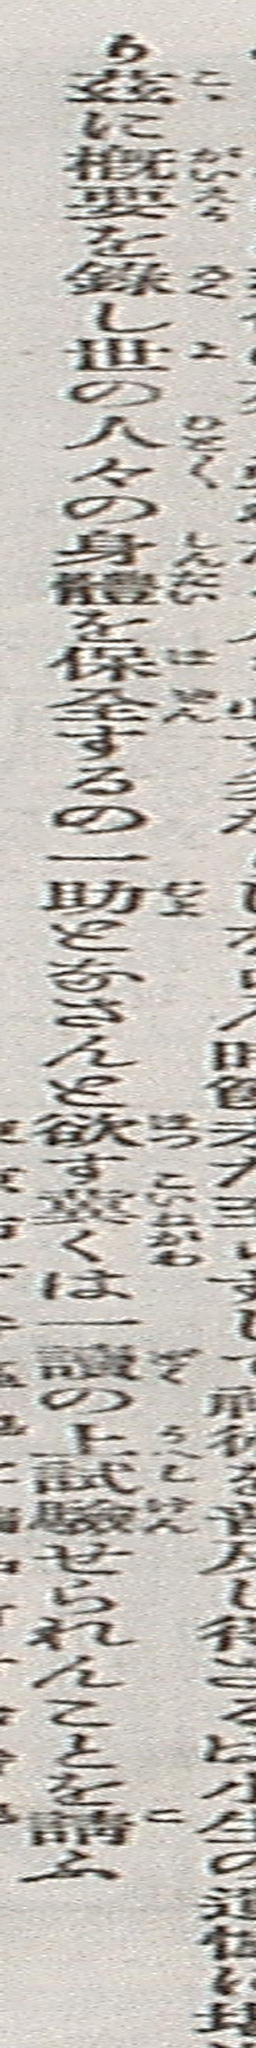り茲に概要を録し世の人々の身体を保全するの一助じよとなさんと欲す冀くは一読どくの上試験せられんことを請ふ
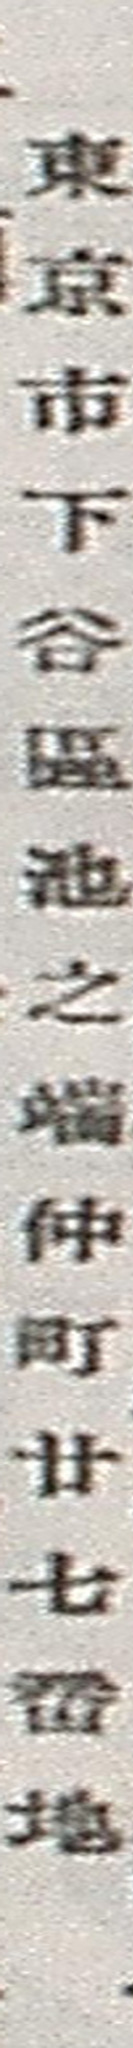東京市下谷区池之端仲町廿七番地
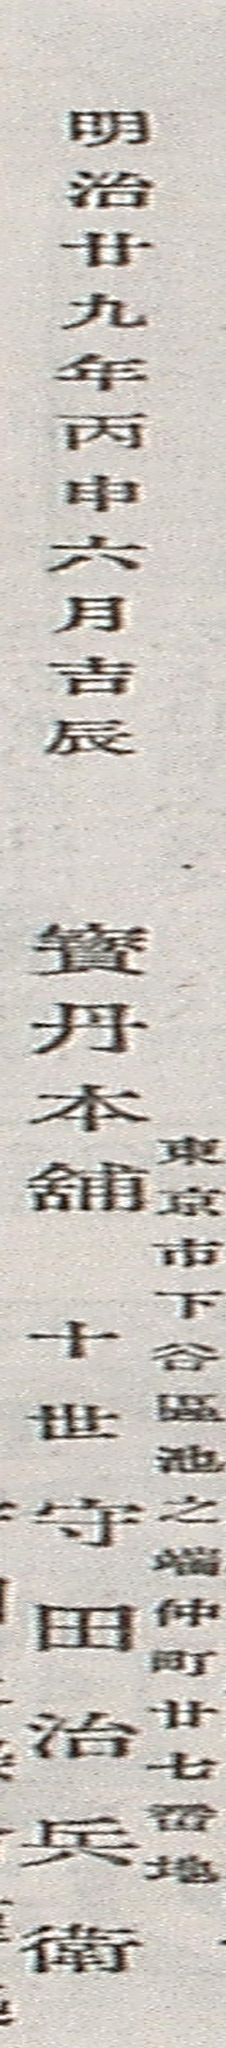明治廿九年丙申六月吉辰宝丹本舗十世守田治兵衛
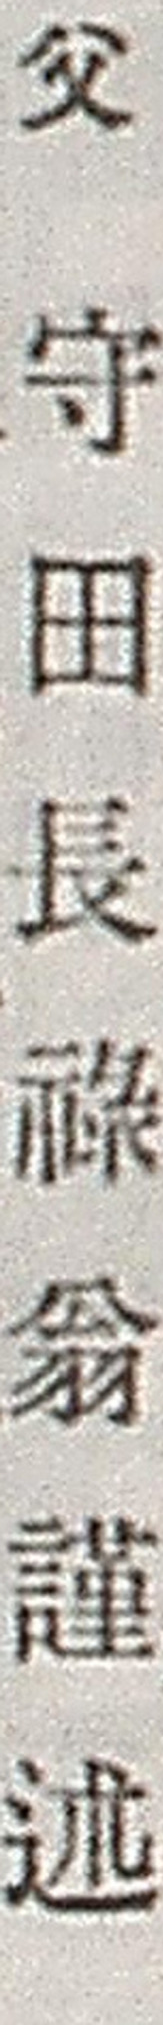父守田長禄翁謹述
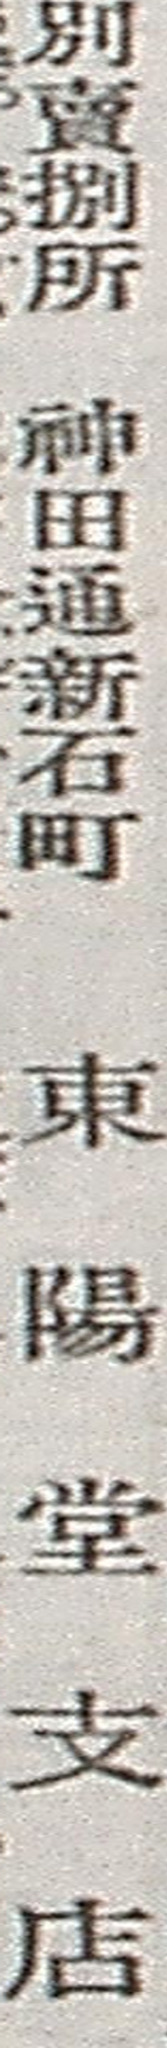特別売捌所神田通新石町東陽堂支店
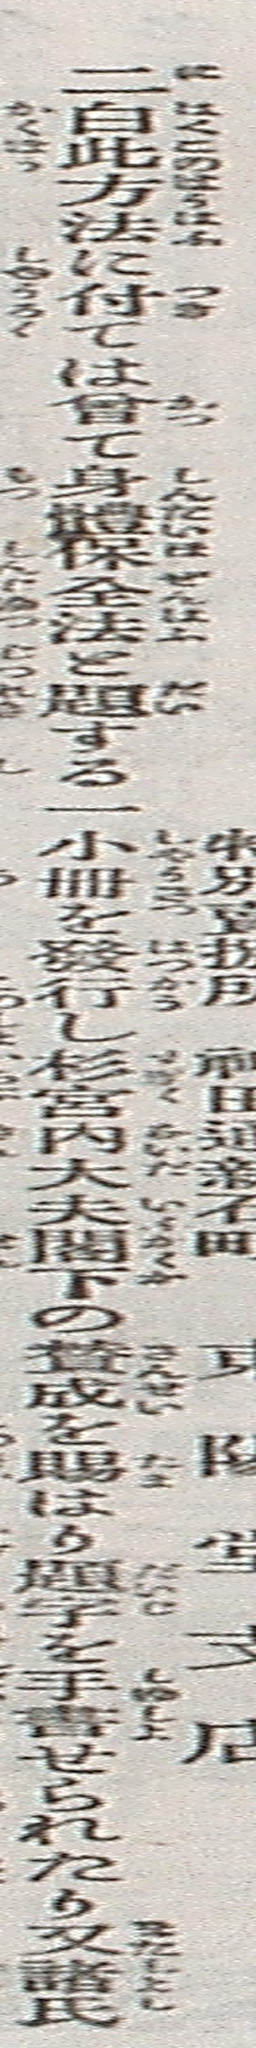二白此方法に付ては曽て身体保全法と題する一小冊しやうさつを発行し杉宮内大夫閣下の賛成を賜はり題字を手書せられたり又諸氏
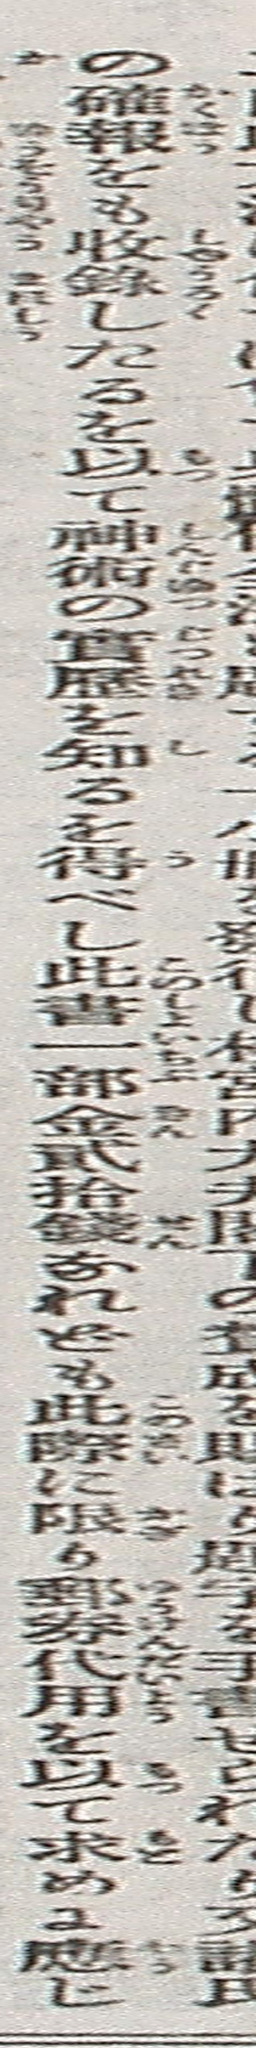の確報をも収録したるを以て神術の実歴を知るを得べし此書一部金弐拾銭せんなれども此際に限り郵券代用を以て求めに応じ
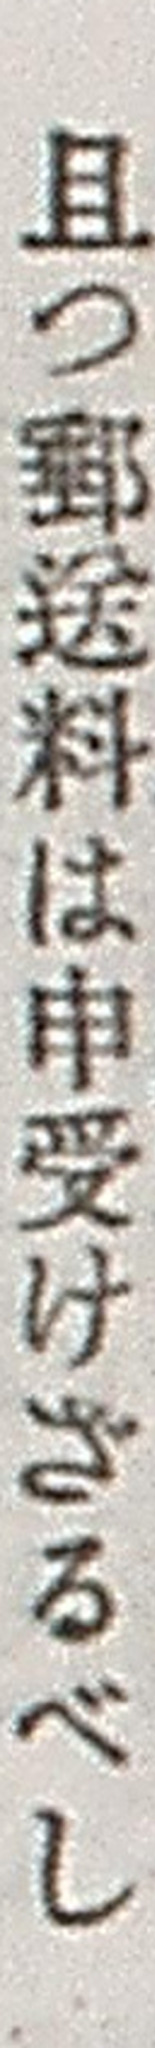且つ郵送料は申受けざるべし

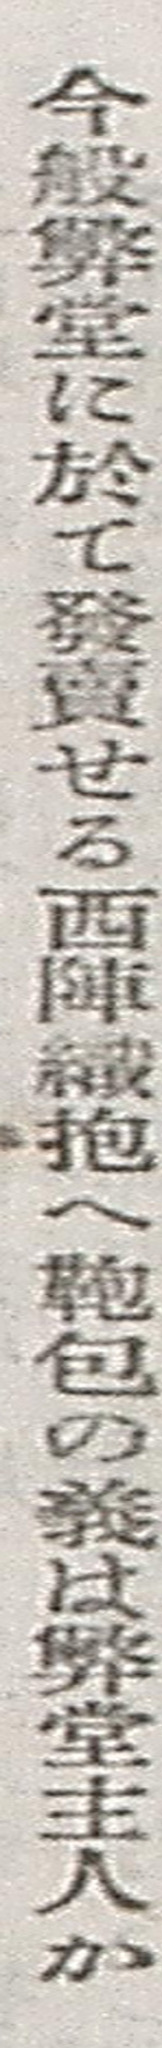今般弊堂に於て発売せる西陣織抱へ鞄包の義は弊堂主人か
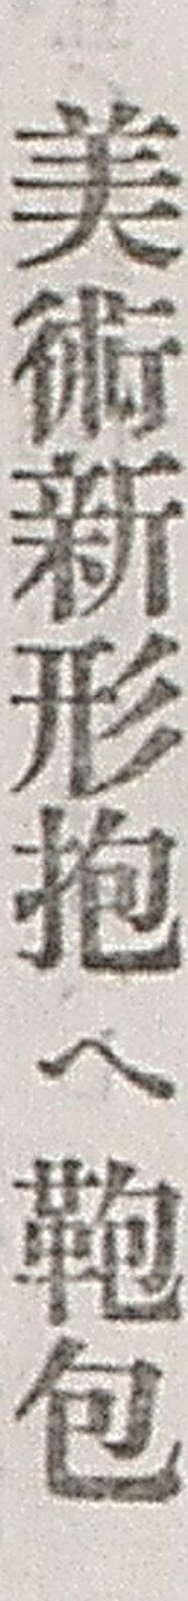美術新形抱へ鞄包
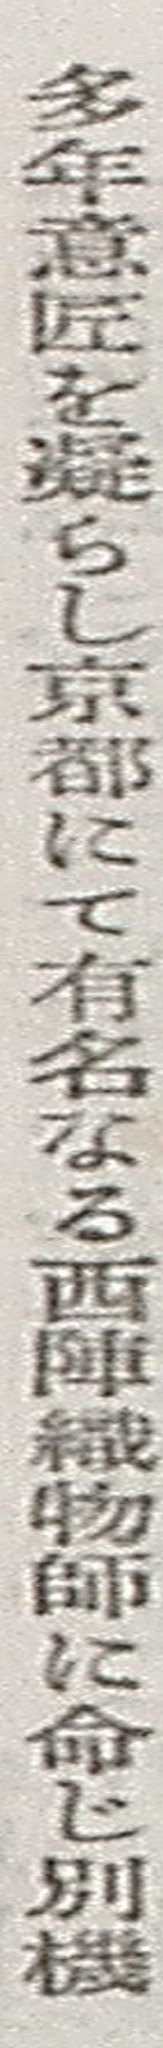多年意匠を凝らし京都にて有名なる西陣織物師に命じ別機
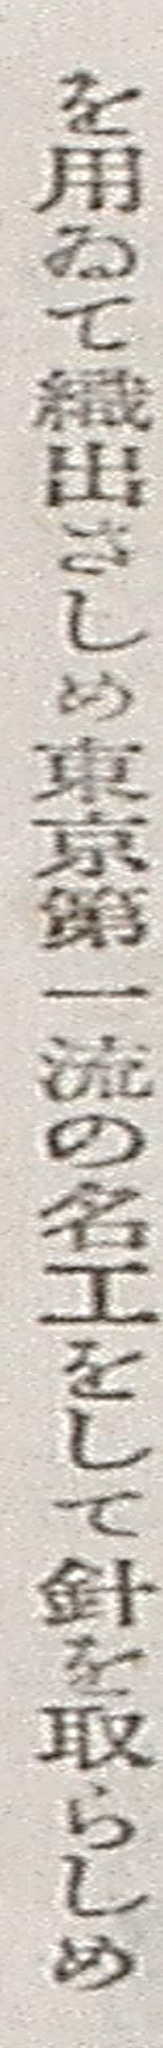を用ゐて織出さしめ東京第一流の名工をして針を取らしめ
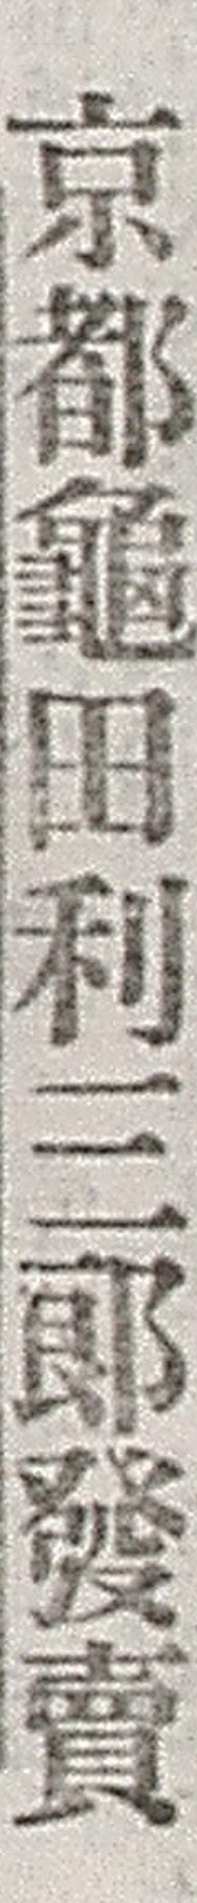京都亀田利三郎発売
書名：風俗畫報臨時増刊第百二十號　大海嘯被害録（下）
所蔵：東京大学地震研究所図書室 Earthquake Research Institute Library, The University of Tokyo, JAPAN
